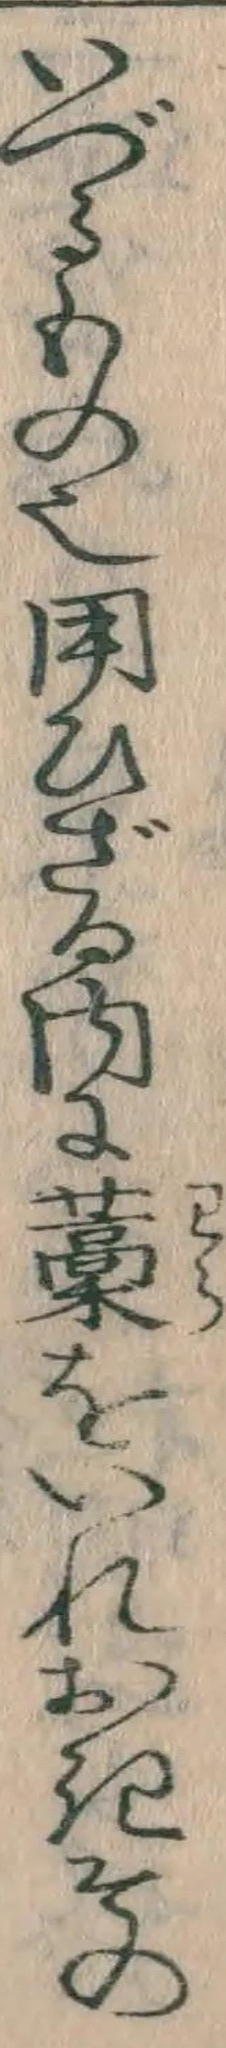いづるもの也用ひざる内に藁をいれおきその
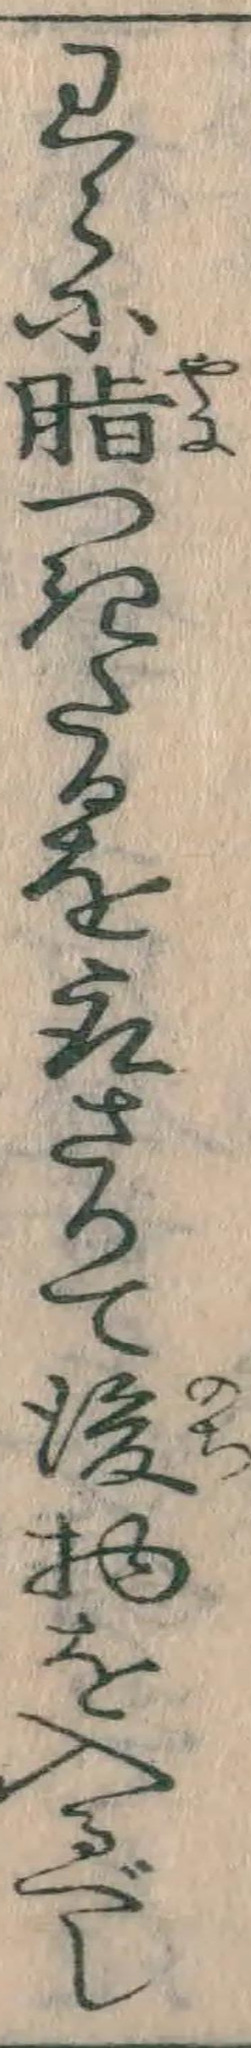わらに脂つきたるを取さりて後物を入るべし
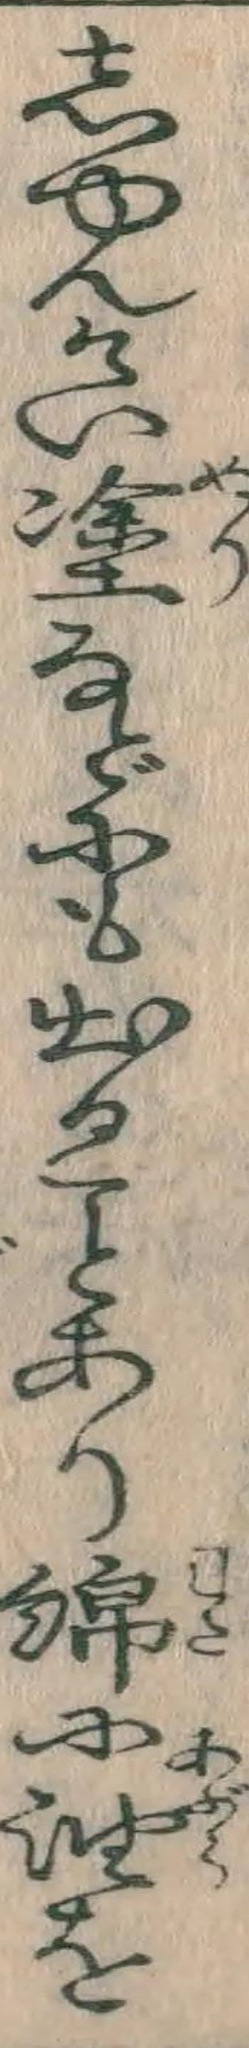しゆんけい塗などにも出ることあり綿に油を
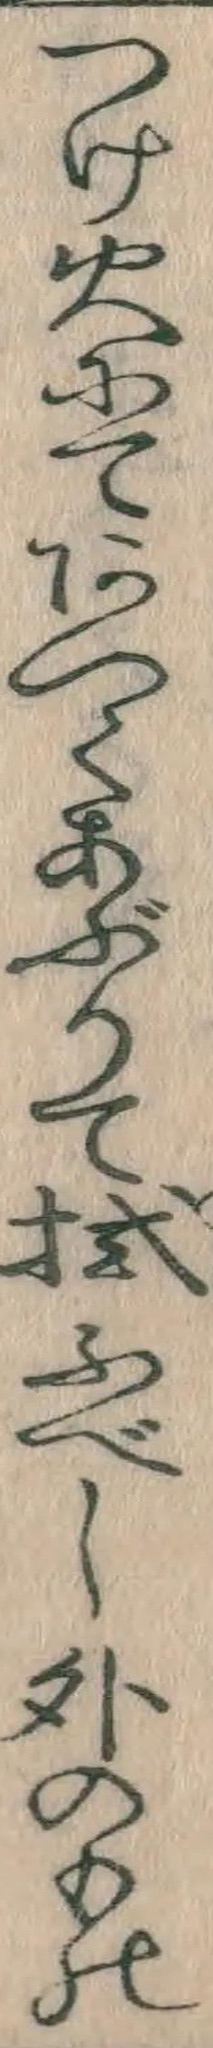つけ火にてあつくあぶりて拭ふべし外のもの
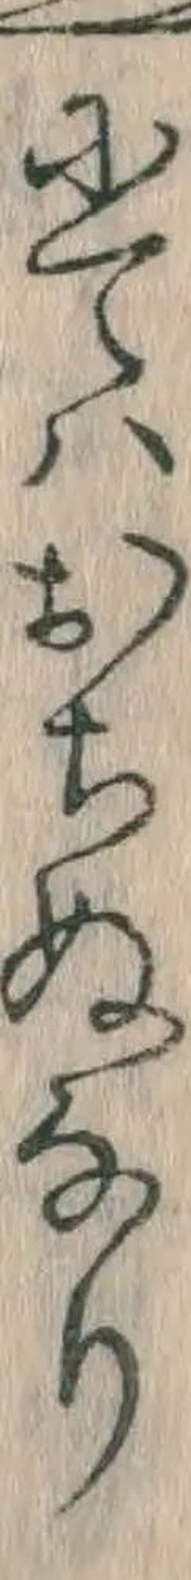にてはおちぬなり
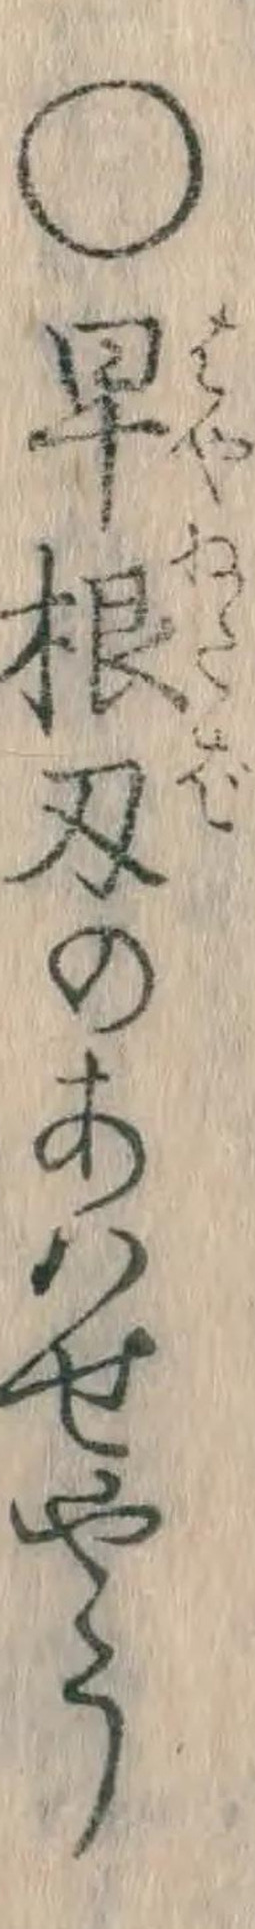○早根刃のあはせやう
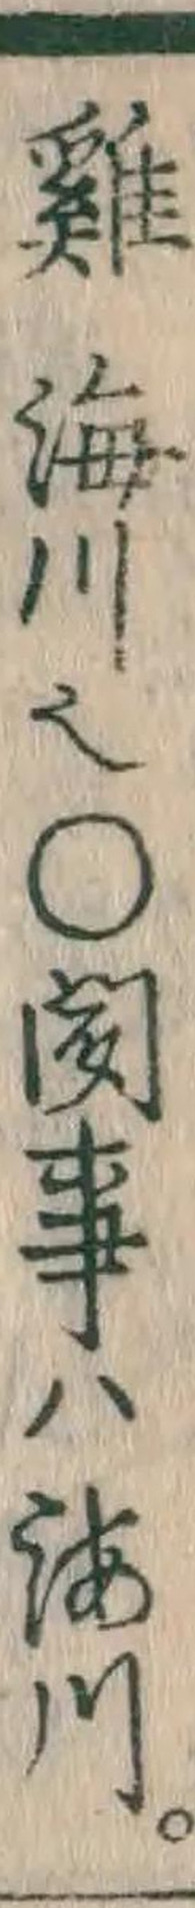鶏海川也○聞事は海川。
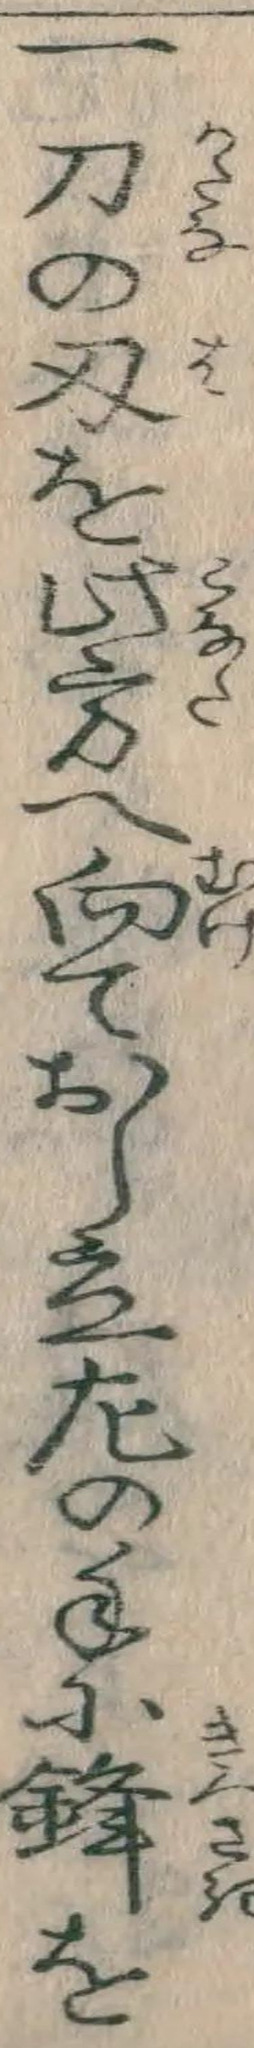一刀の刃を此方へ向ておし立左の手に鋒を
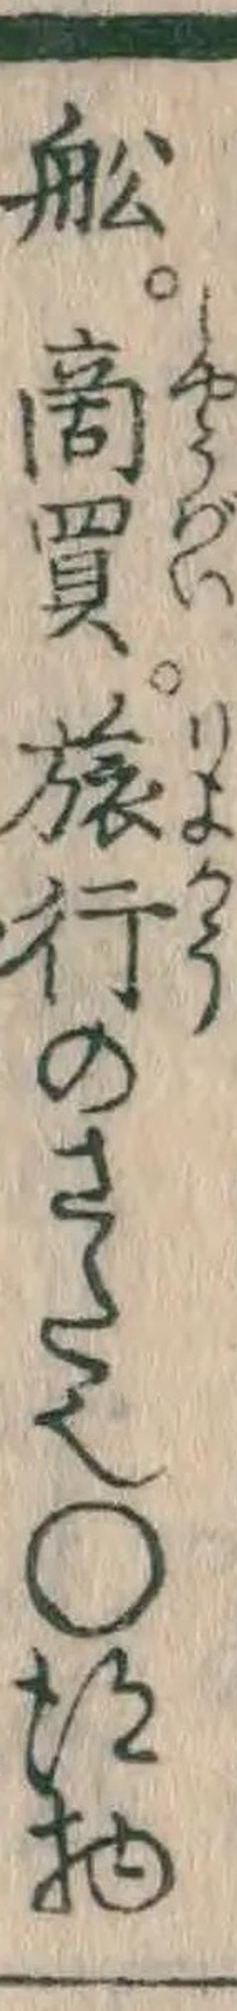船。商売。旅行のさた也○得物
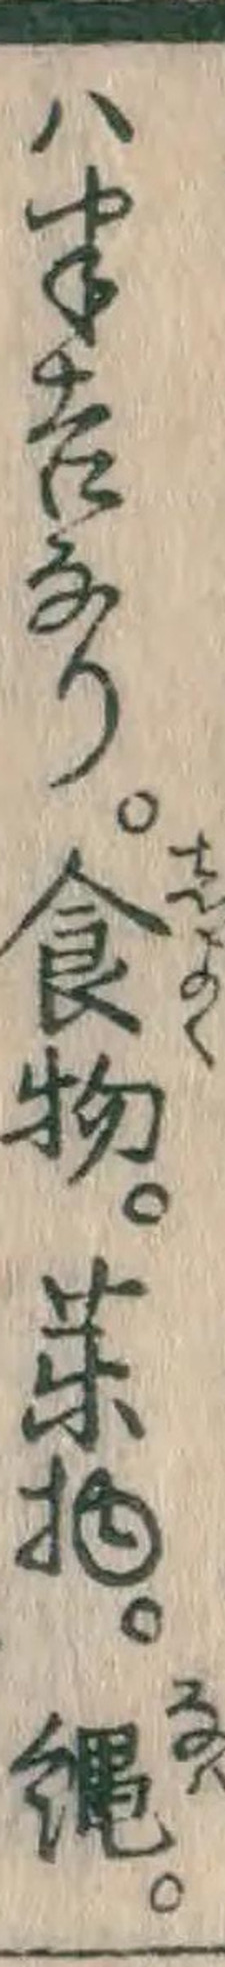は半吉なり。食物。薬物。縄。
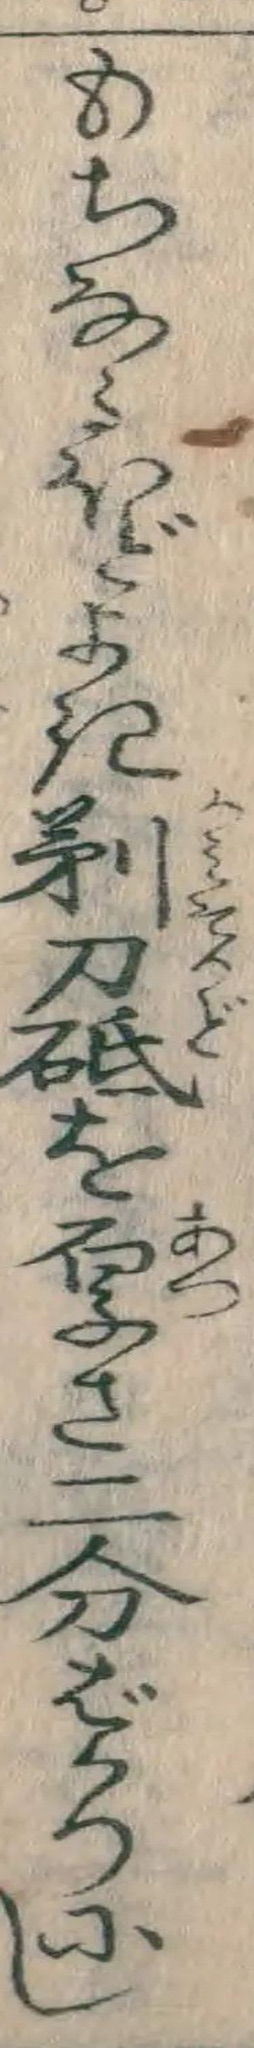もちなるほどよき剃刀砥を厚さ二分ばかりにし
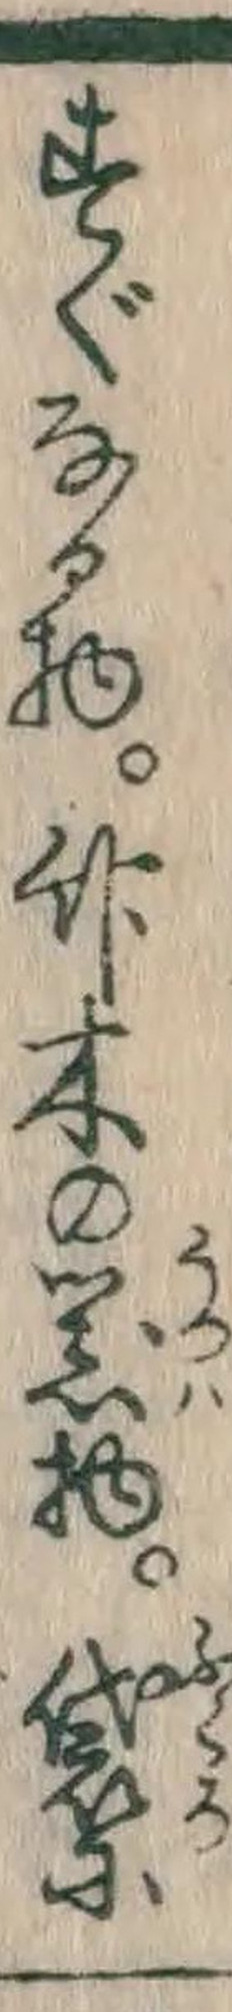すぐなる物。竹木の器物。袋に
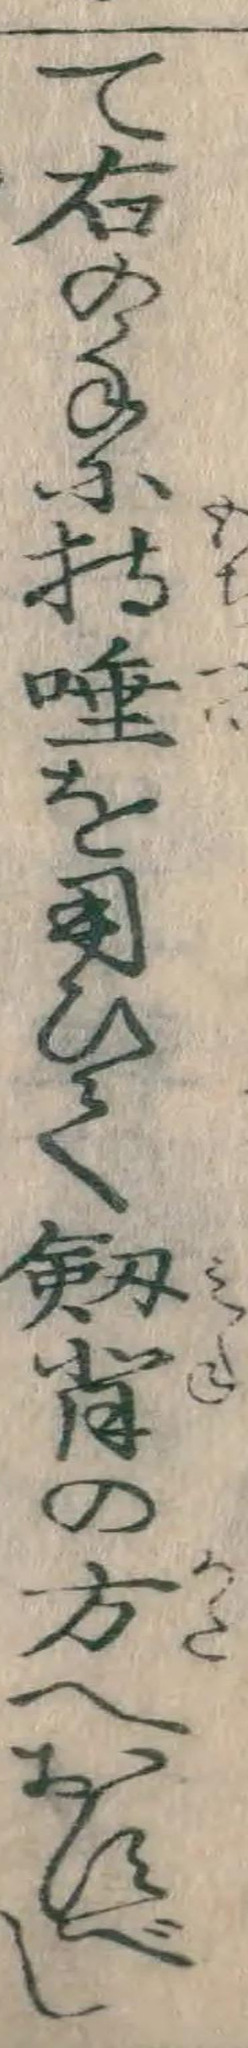て右の手に持唾を用ひて剣背の方へおすべし
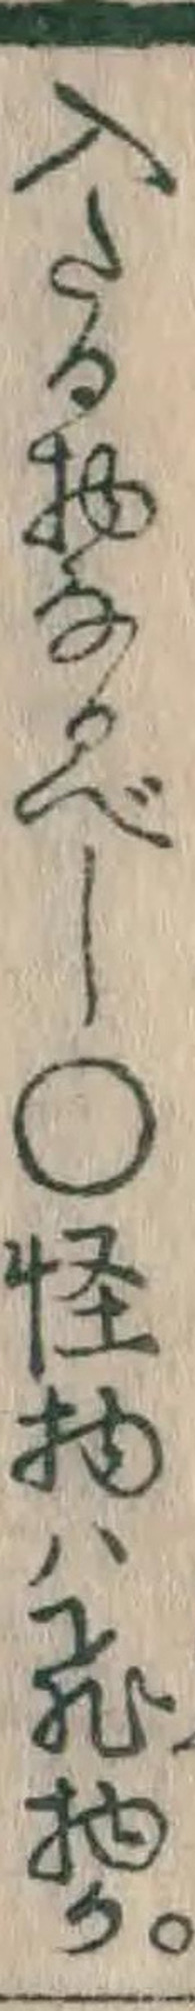入たる物なるべし○怪物は飛物か。
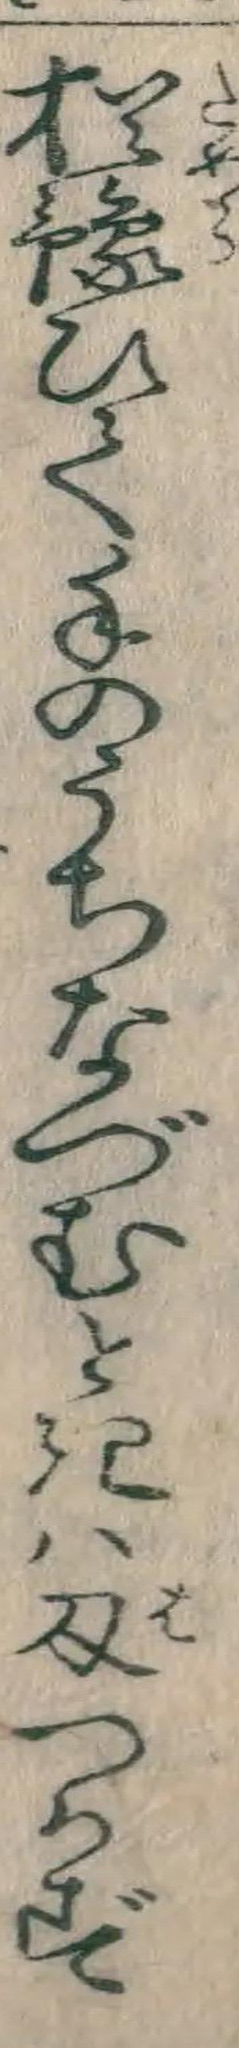猶予ひて手のうちなづむときは刃つかず
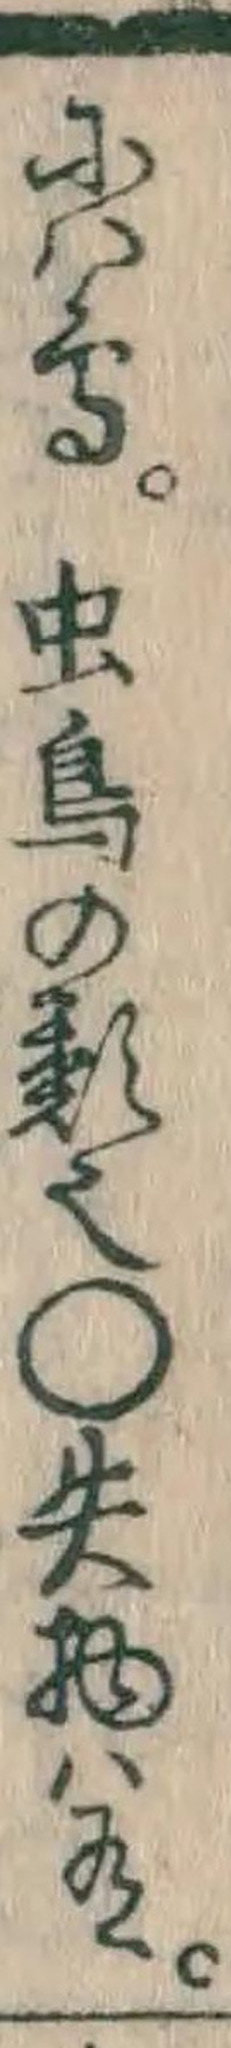には鳥。虫鳥の類也○失物は有。
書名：広益秘事大全 3巻. [1]
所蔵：国立国会図書館 National Diet Library, JAPAN
